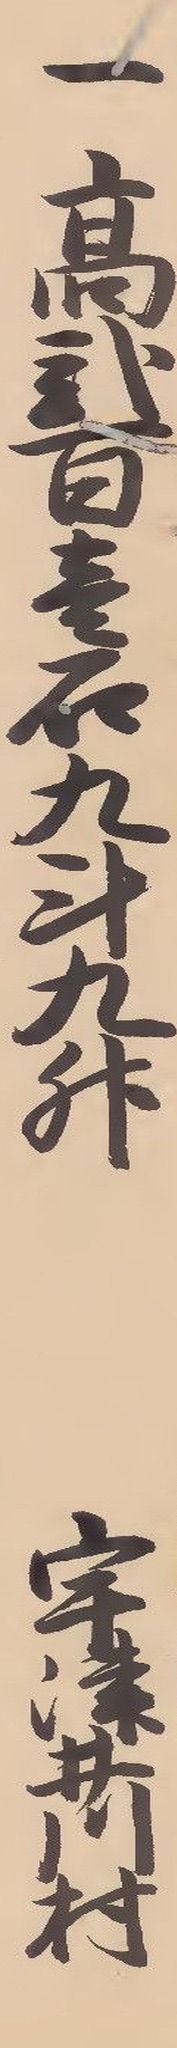一高弐百壱石九斗九升宇津井川村
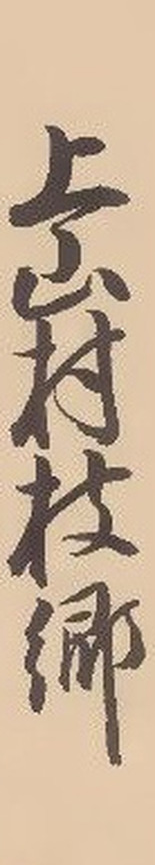上山村枝郷
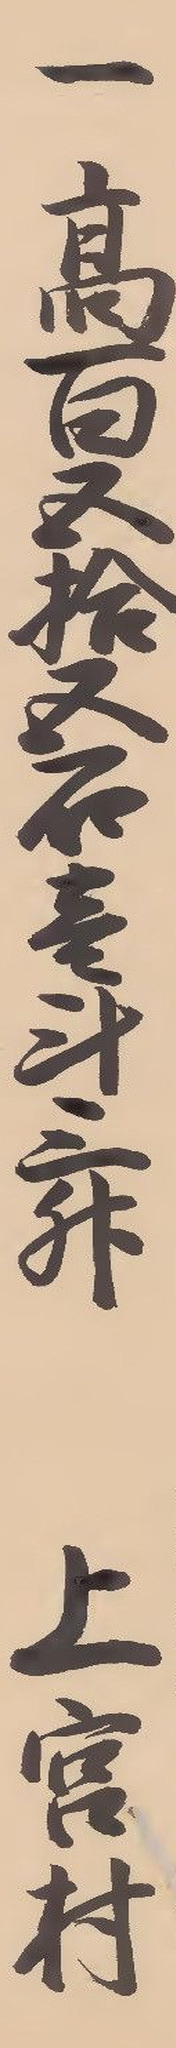一高百五拾五石壱斗三升上宮村
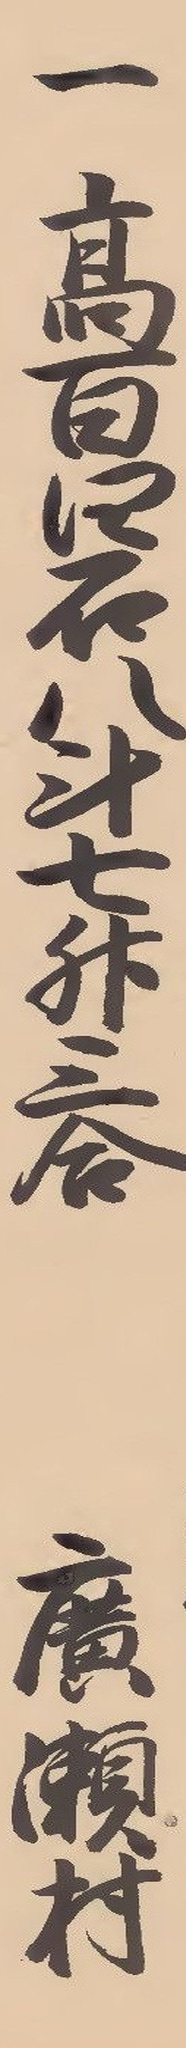一高百四石八斗七升三合廣瀬村
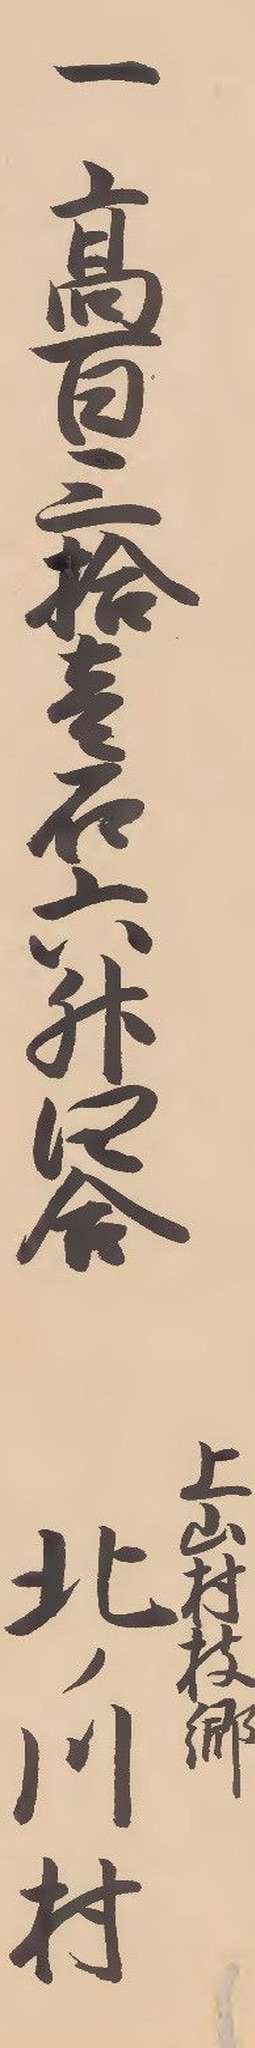一高百三拾壱石六升四合北ノ川村
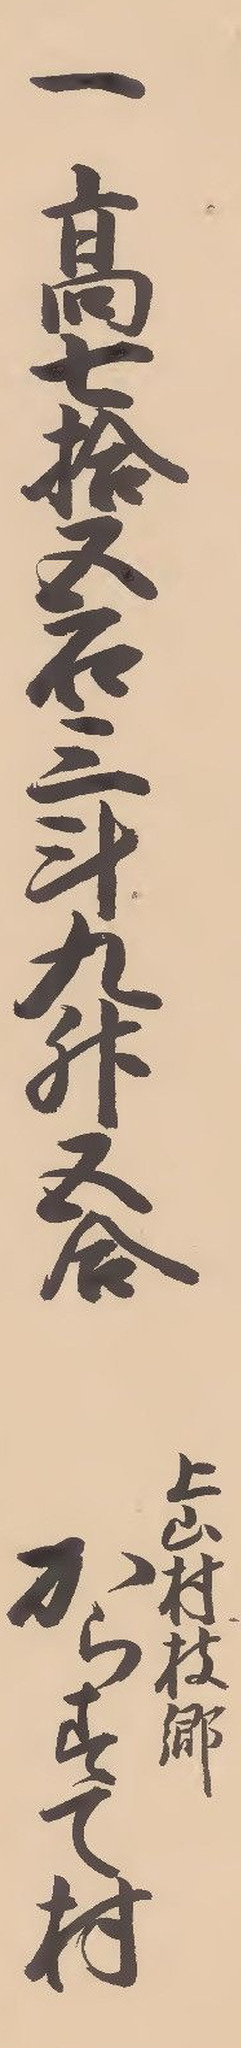一高七拾五石三斗九升五合からすて村
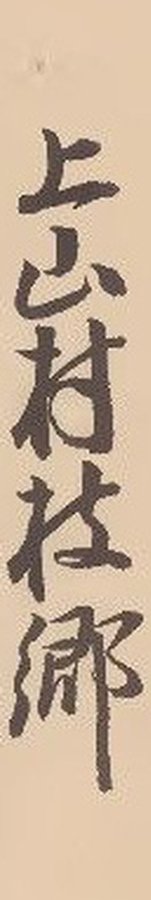上山村枝郷
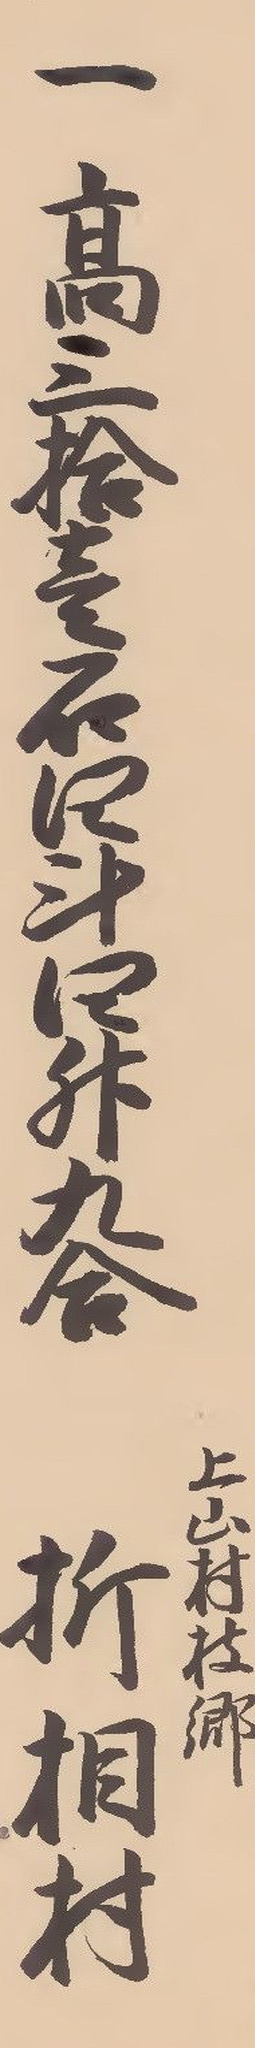一高三拾壱石四斗四升九合折相村
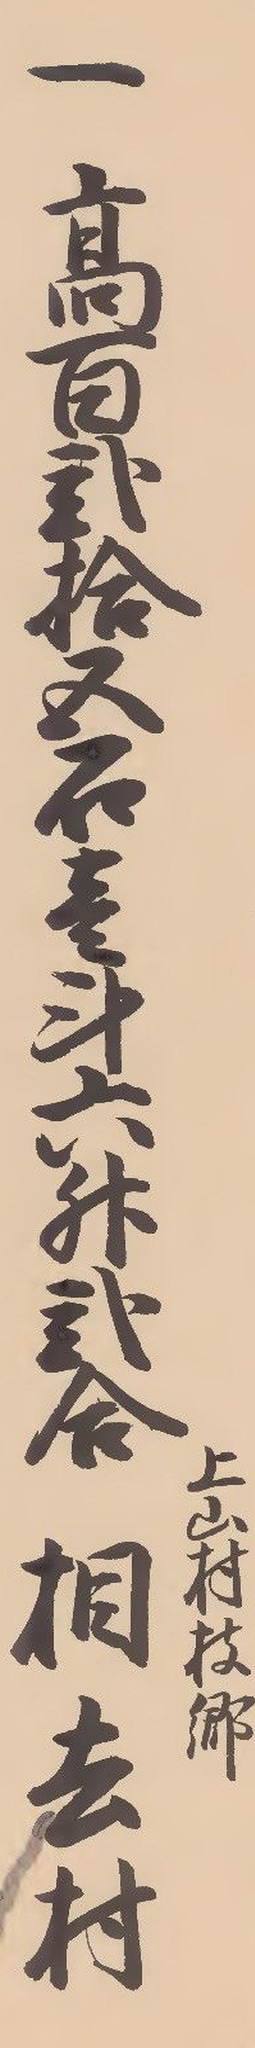一高百弐拾五石壱斗六升弐合相去村
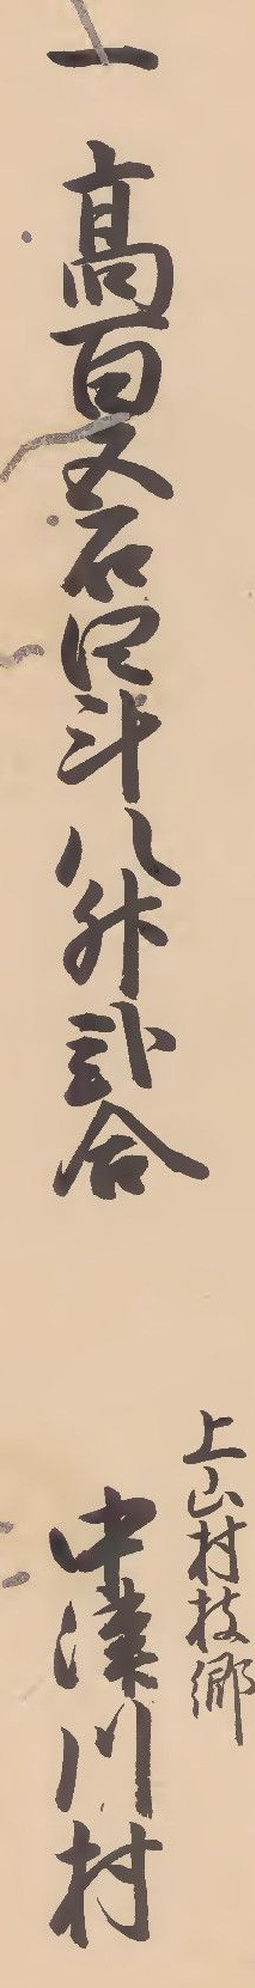一高百五石四斗八升弐合中津川村

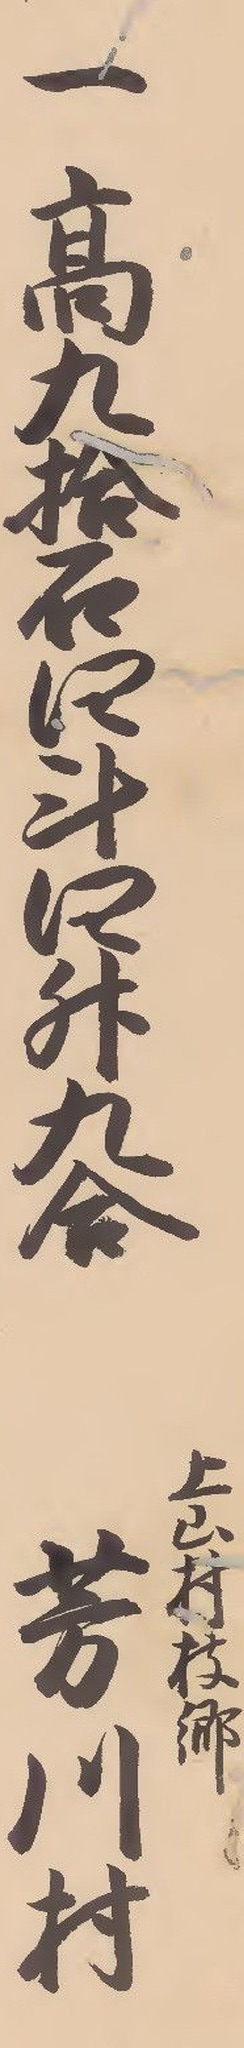一高九拾石四斗四升九合芳川村
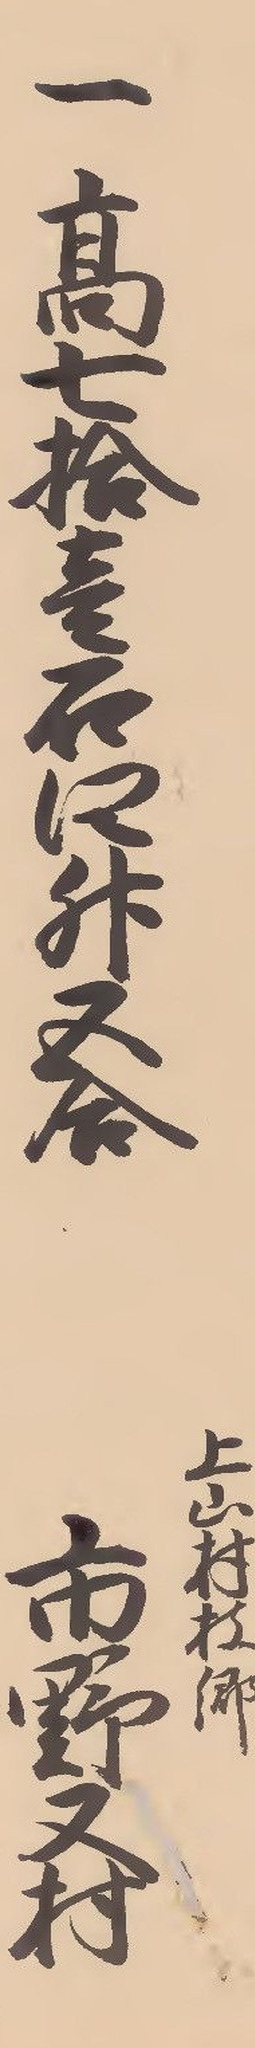一高七拾壱石四升五合市野又村
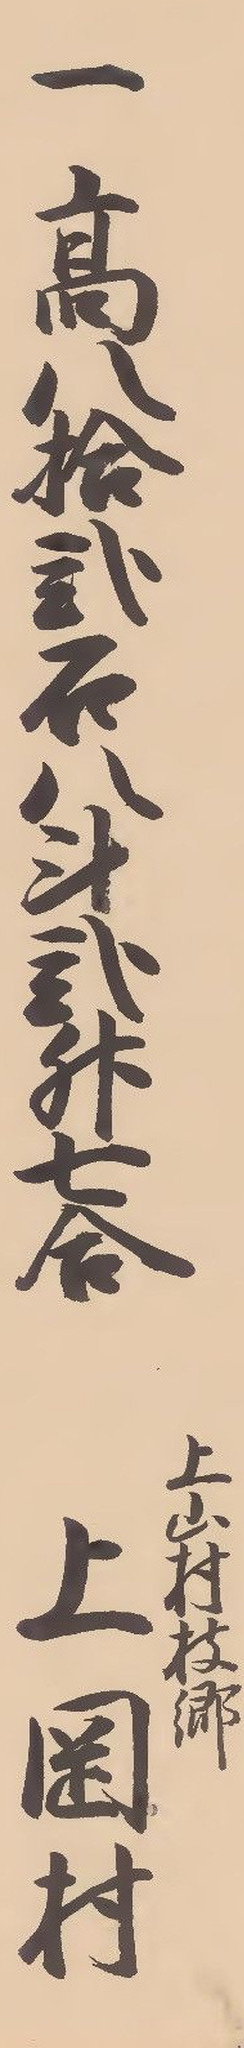一高八拾弐石八斗弐升七合上岡村
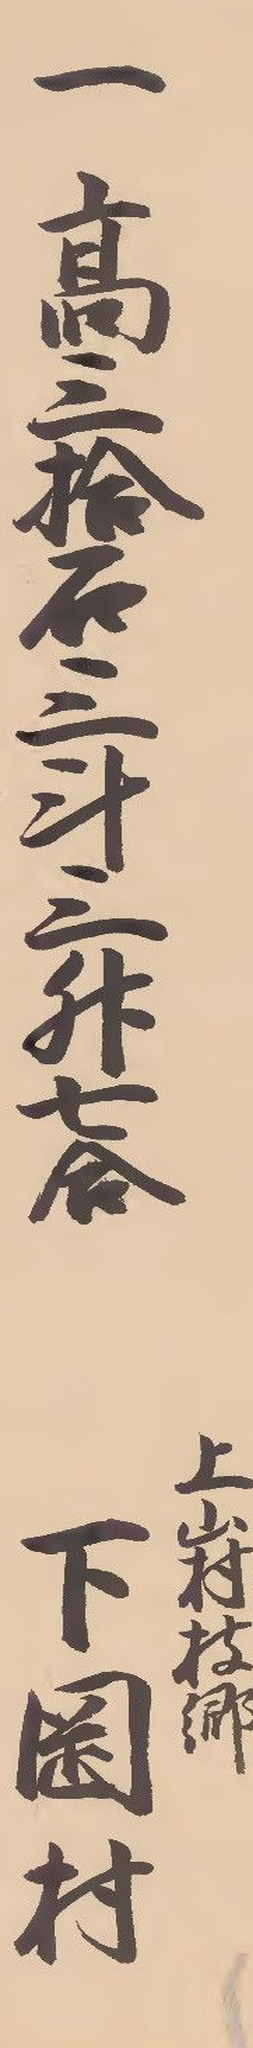一高三拾石三斗三升七合下岡村
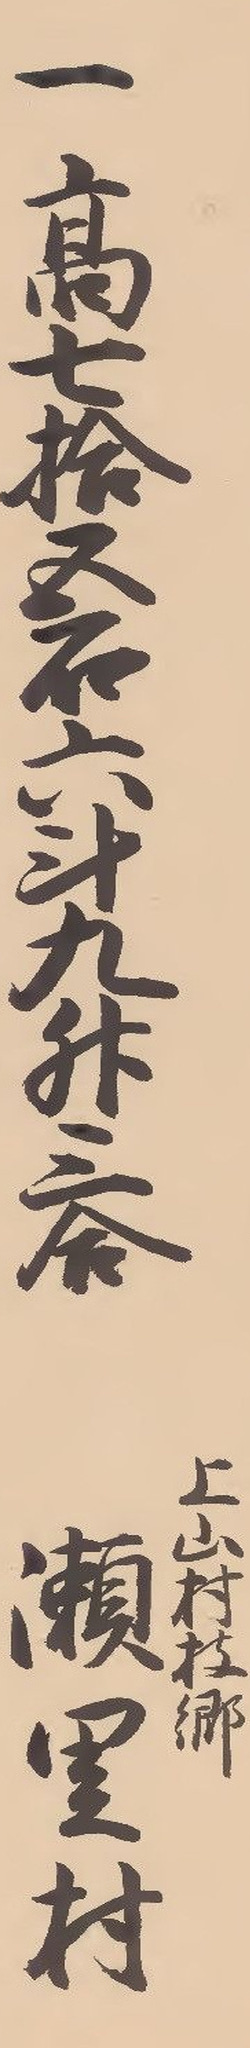一高七拾五石六斗九升三合瀬里村
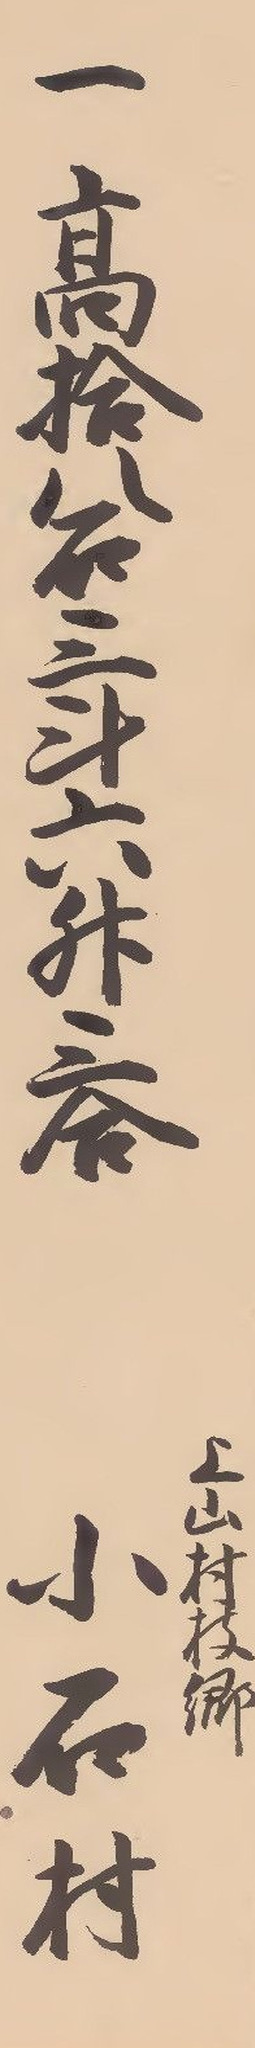一高拾八石三斗六升三合小石村
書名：土佐国郷帳
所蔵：国立公文書館 National Archives of Japan
